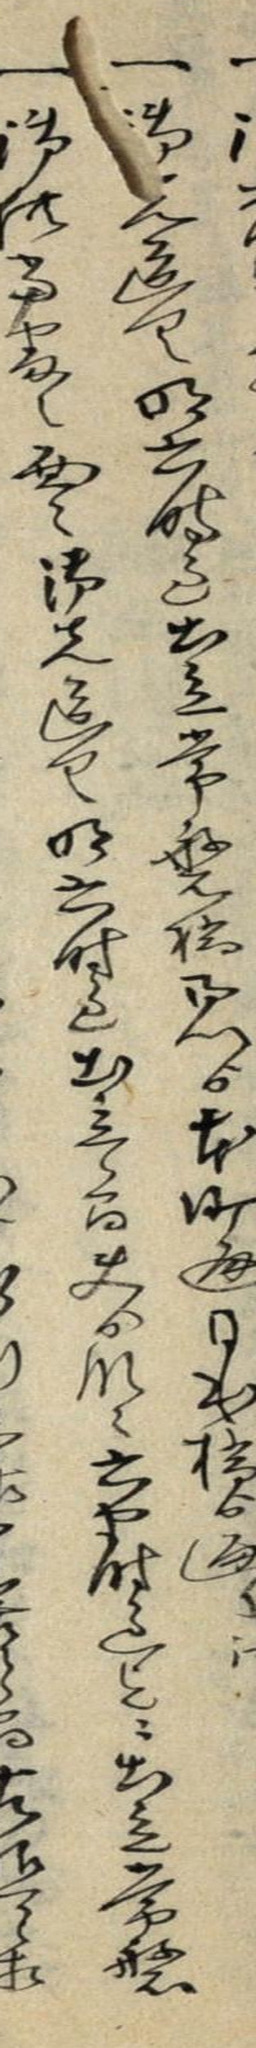一御供当番之面々御先道具明六時過出立候間夫ゟ段々六半時過迄に出立常盤
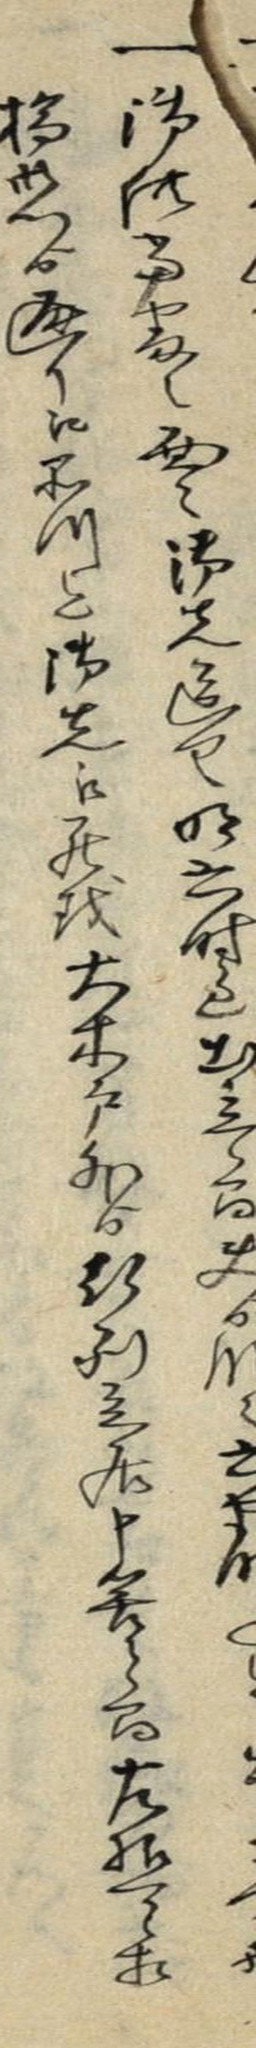橋御門ゟ通り江品川迄御先江罷越大木戸外ゟ行列立居申筈に候間左様可被相
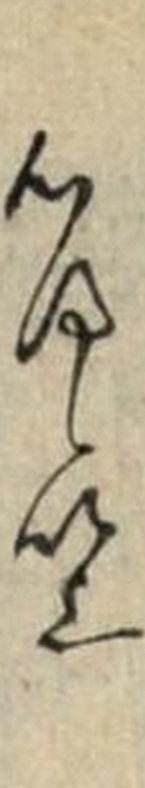心得候以上
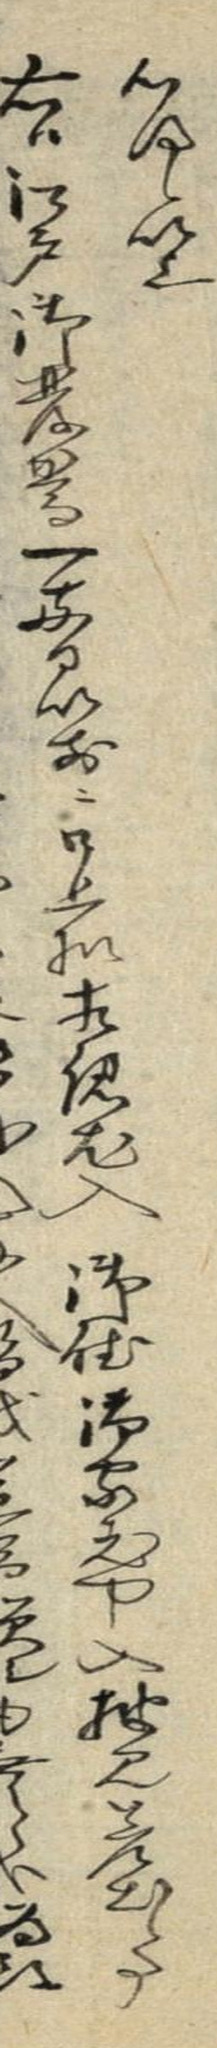右は江戸御発駕一両日以前に口上扣相認尤入聴御家老中入披見差出候事
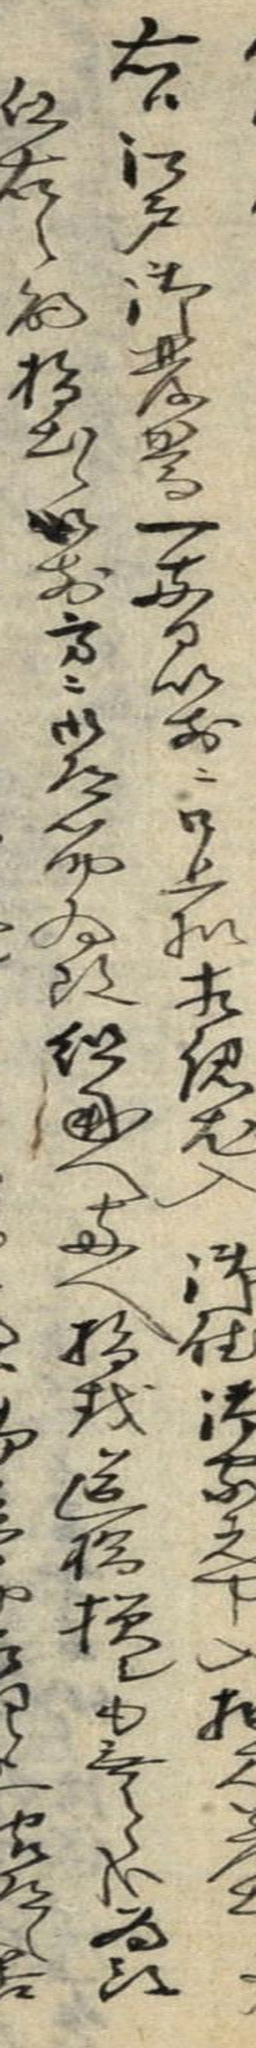但右之触指出候以前方々御道筋為改組用人両人指越道橋損しも無之哉為致
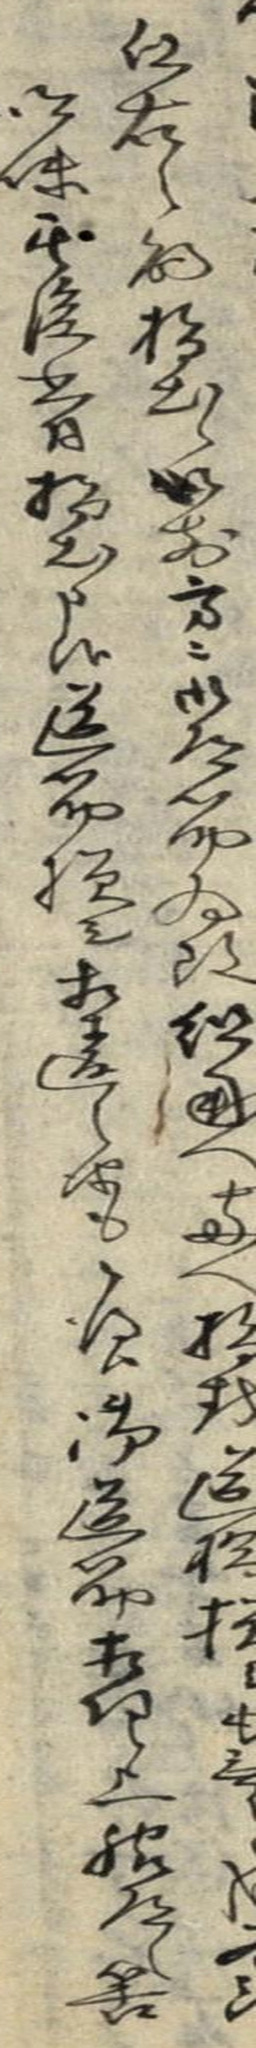吟味其後書付指出申候道筋損し相違之儀も候得は御道筋相伺之上脇道之筈
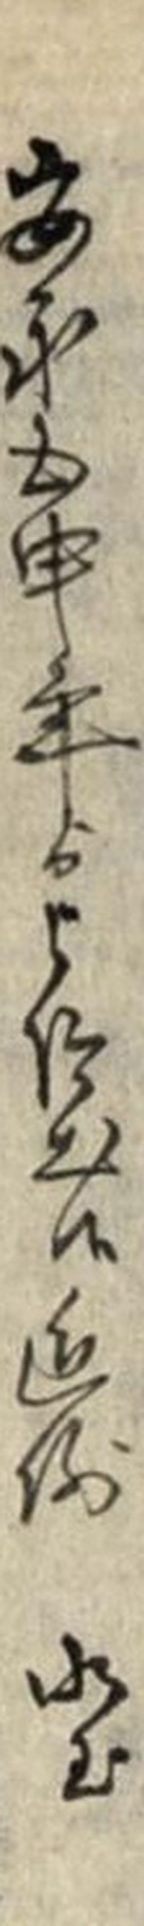安永五申年ゟ被仰出候近例水玉
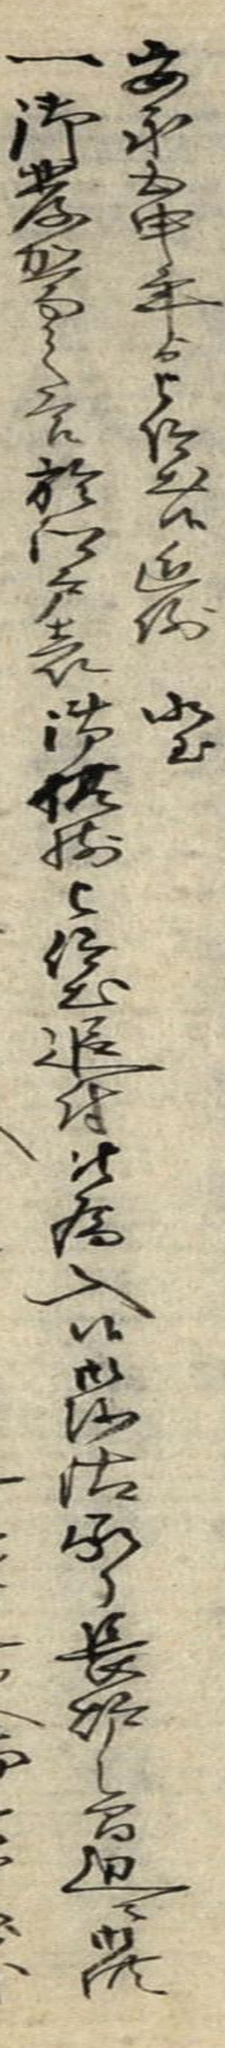一御発駕之節於江戸表御供揃被仰出追付被為入候御沙汰承り長炉之間辺に御供
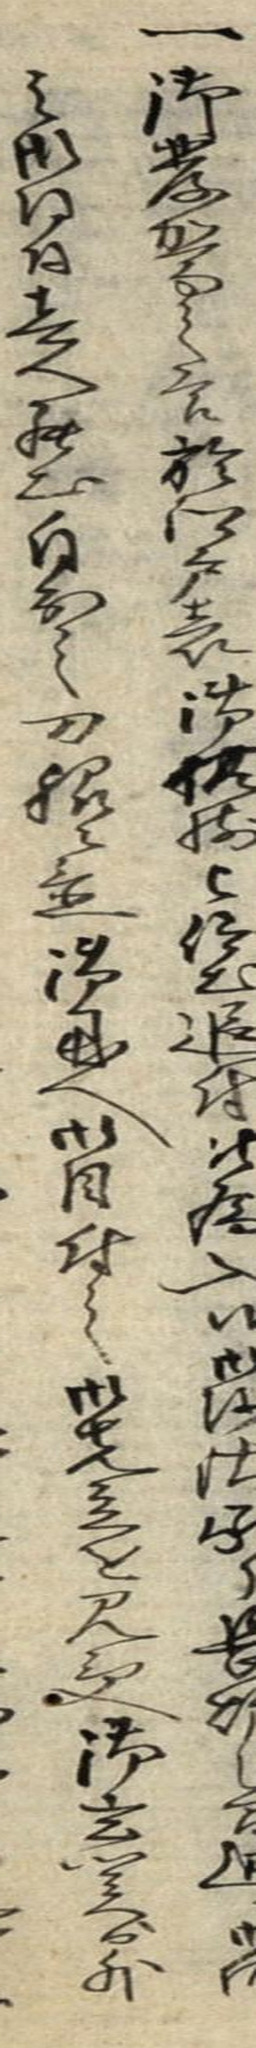之御目付壱人罷出自分之刀脇に置御用人御目付之御先立を見受御玄関ゟ外
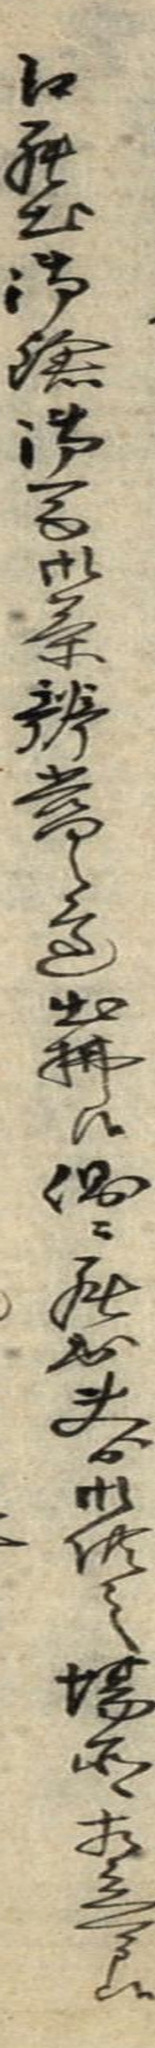江罷出御鎗御馬御茶弁当之遂出払候側に罷出夫ゟ御供之場所へ相立可申候
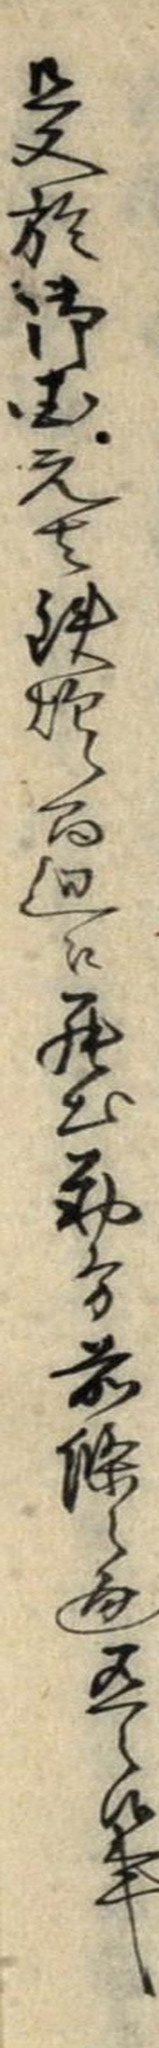且又於御国元は鉄炮之間辺江罷出勤方前條之通有之候事

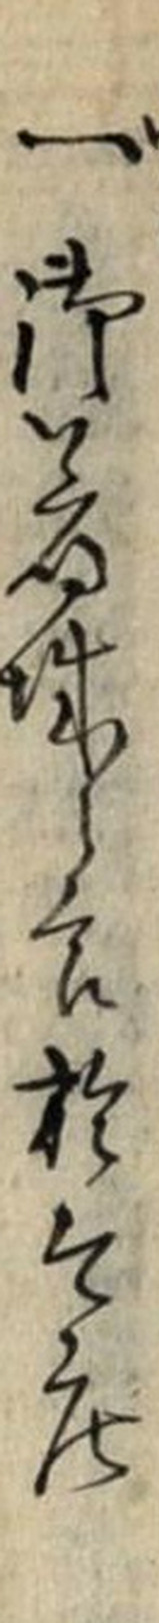一御着城之節於今庄
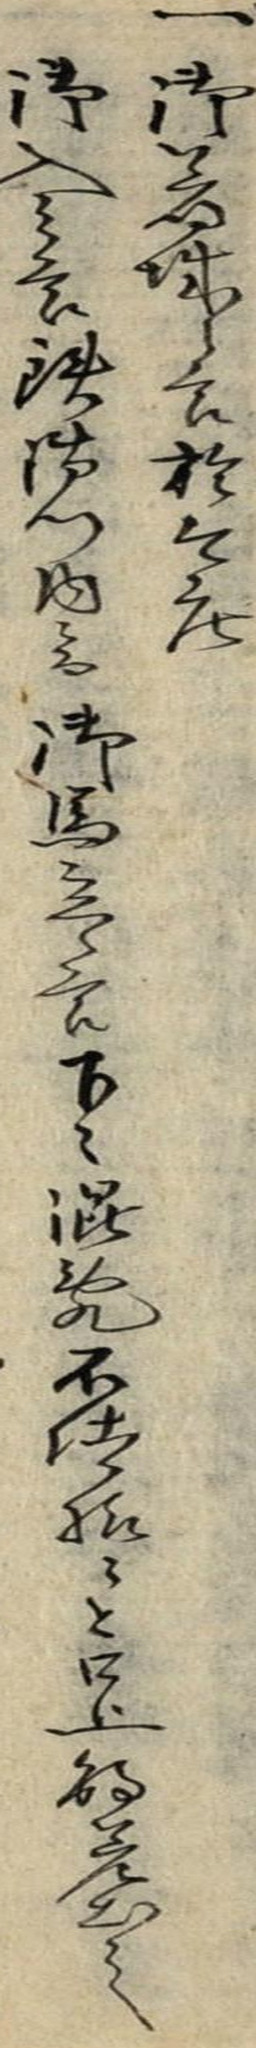御入之節鉄御門内にて御馬立候節下々混乱不仕候様にと口上触差出之
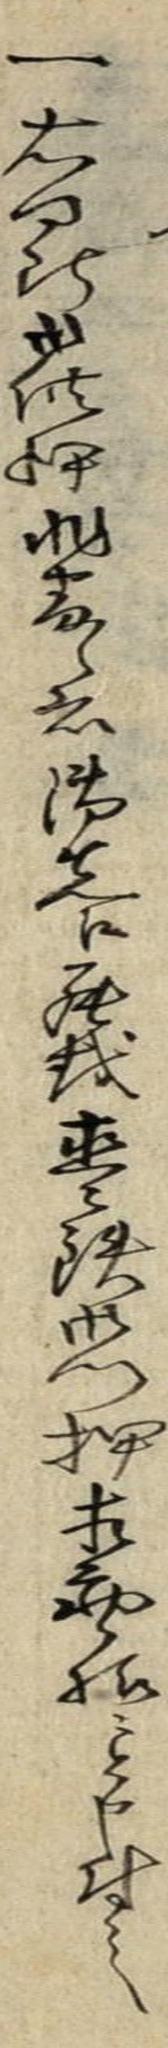一右同断御供押非番之者御先江罷越直々鉄御門押相勤候様にと申付之
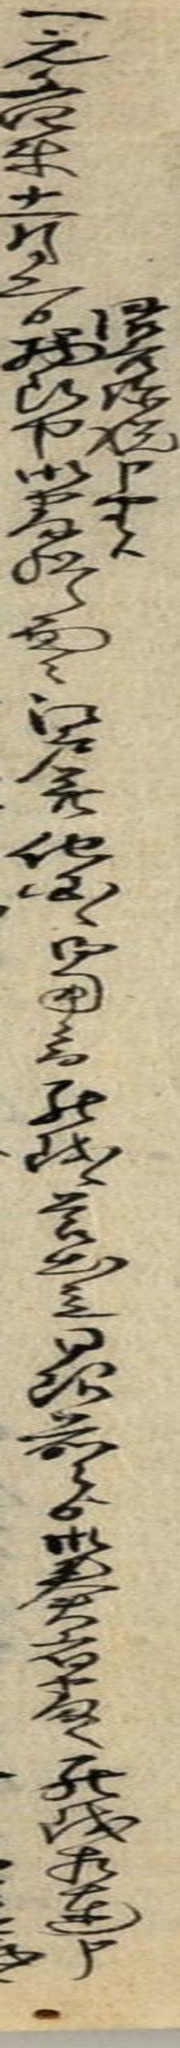一元文四未十一月二日物頭中御番組之面々江戸并他国へ御用にて罷越候節出立日限前々ゟ御奏者番へ罷越相達申
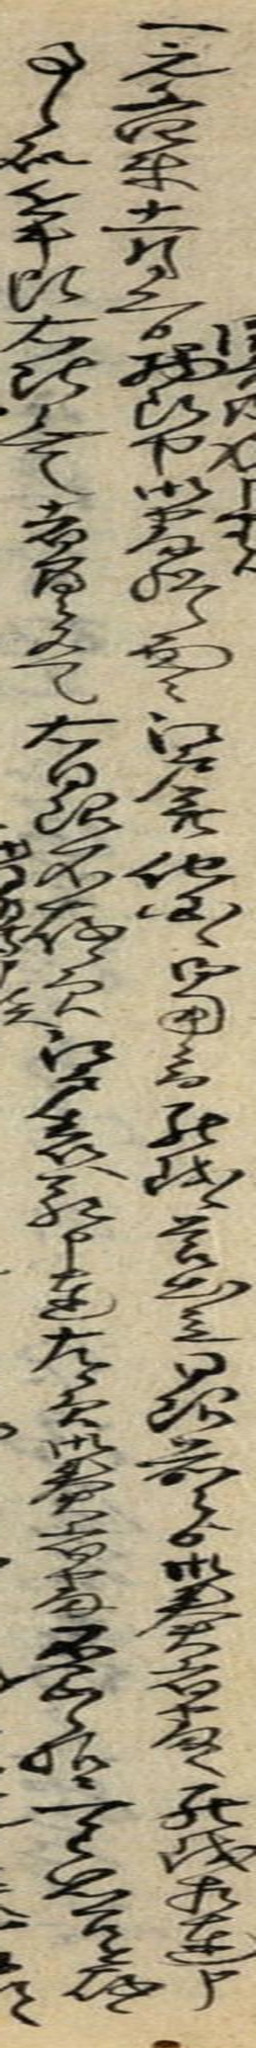事候処近年き頃右断無之者間々有之右日限不存候ては江戸表へ難申達左候ては御奏者番不念候様に可被思召と存候
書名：三都并道中之部
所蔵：福井県文書館 Fukui Prefectural Archives
